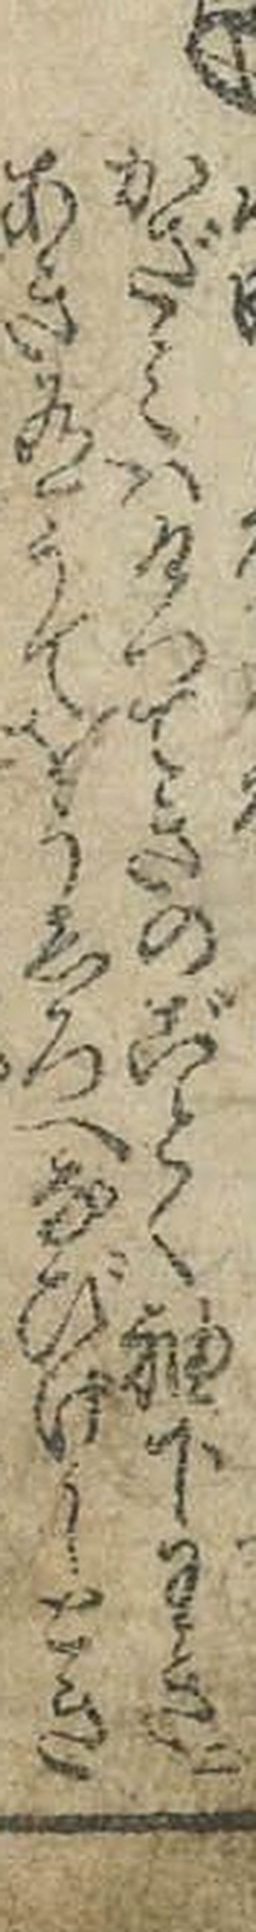あき有うてをうしろへなびけしとき

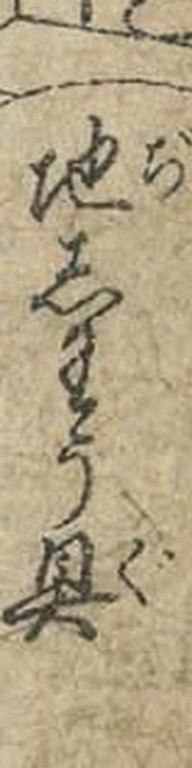地しわう具
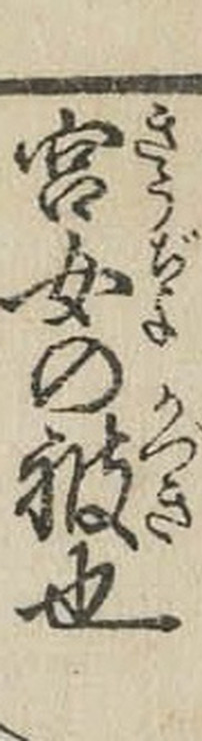宮女の被也
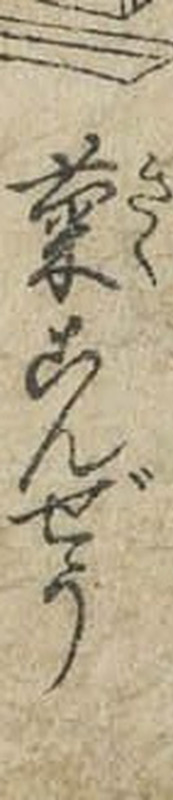菊こんぜう
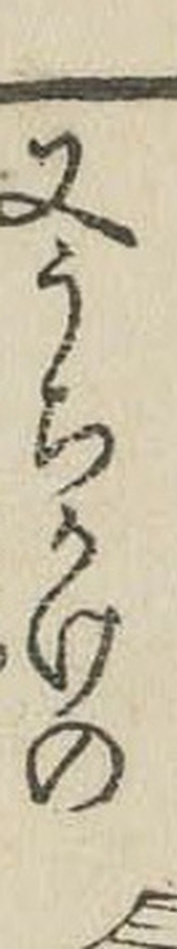又うちかけの
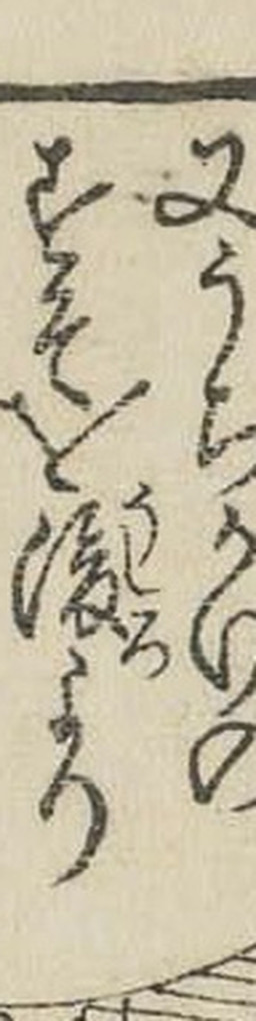すそを後より
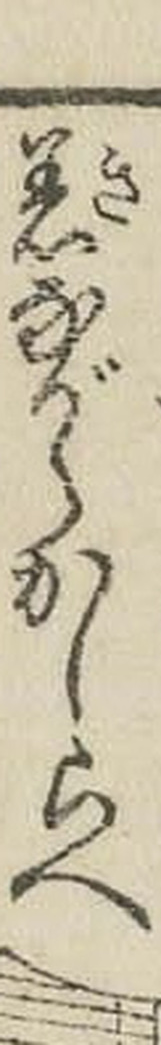着ながらかしらへ
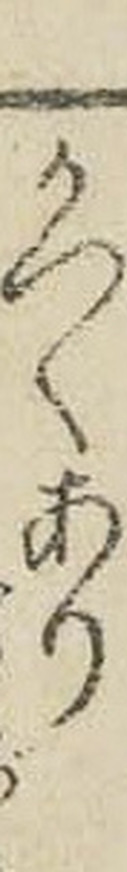かつくあり
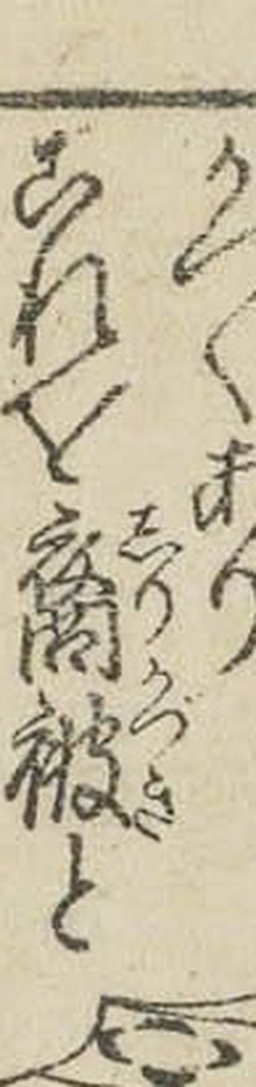これを裔被と

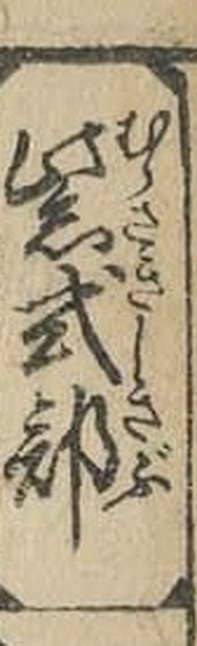紫式部
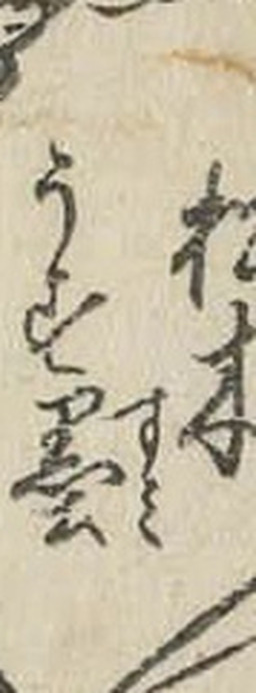うす墨
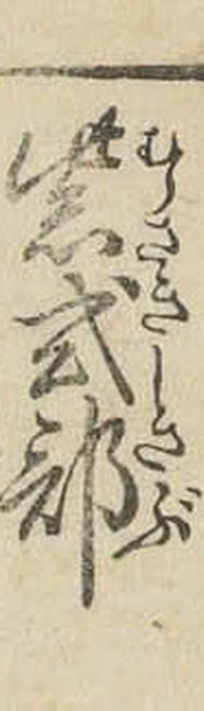紫式部
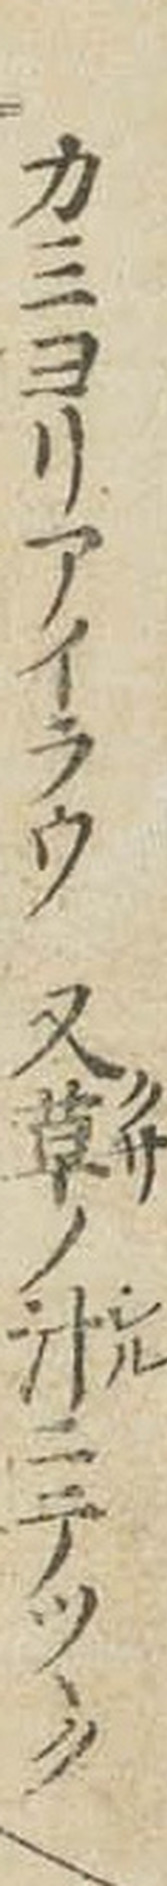カミヨリアイラウ又草ノ汁ニテツヽク
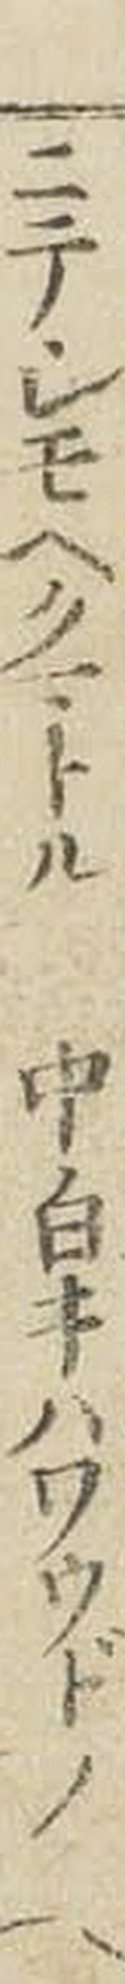ニテシモヘクマトル中白キハワウドノ
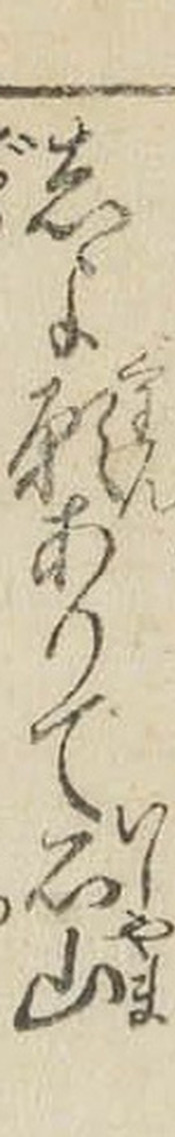しよ願ありて石山
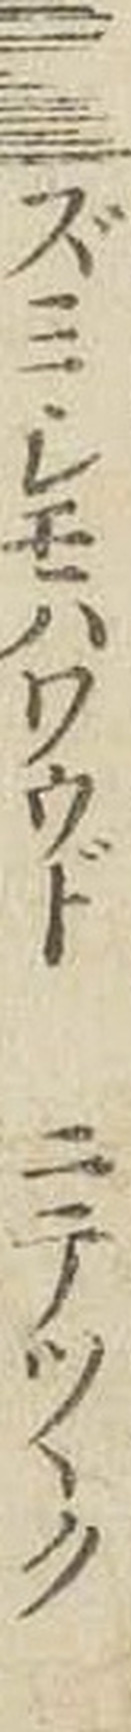ズミシモハワウドニテツヽク
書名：絵本写宝袋 9巻 1之巻
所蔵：東京学芸大学教育コンテンツアーカイブ
